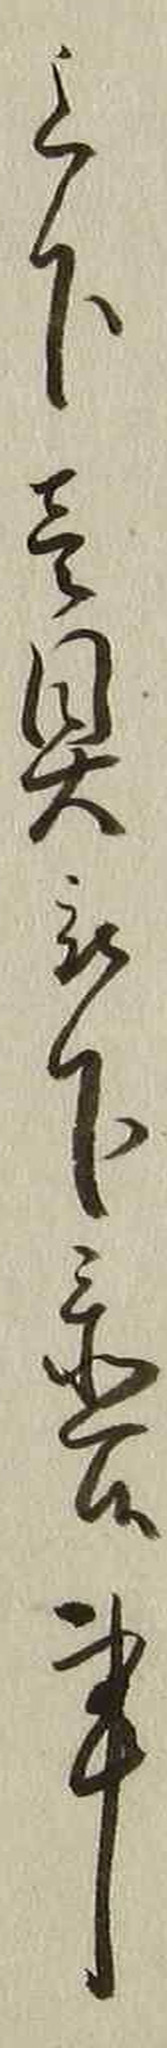上下壱具被下置候事
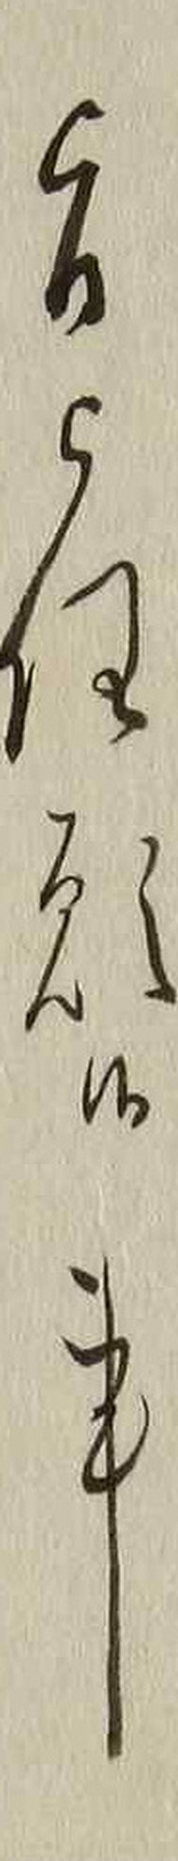旨被任願候事
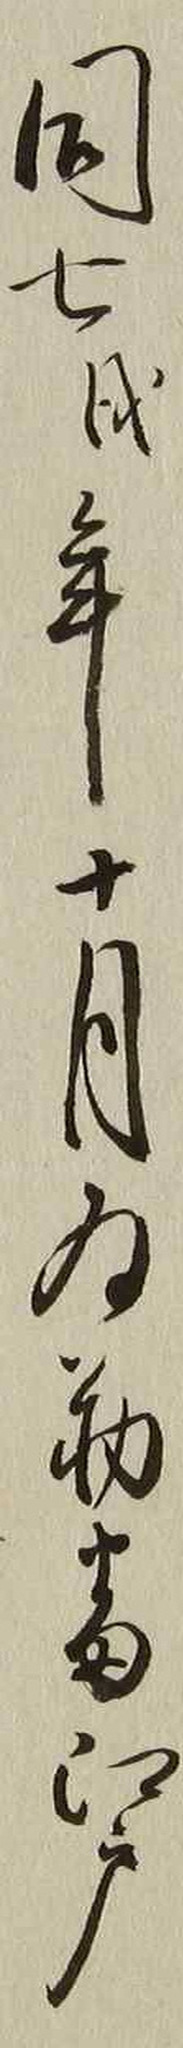同七戌歳十月為勤番江戸
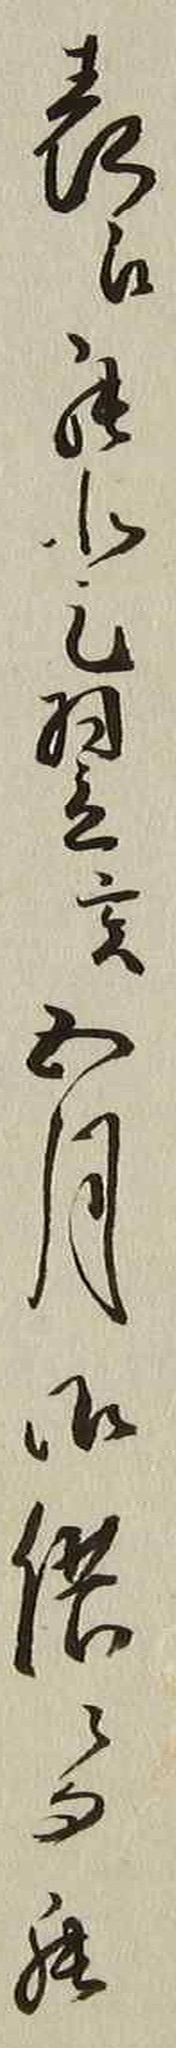表江罷登翌亥五月御供ニ而罷
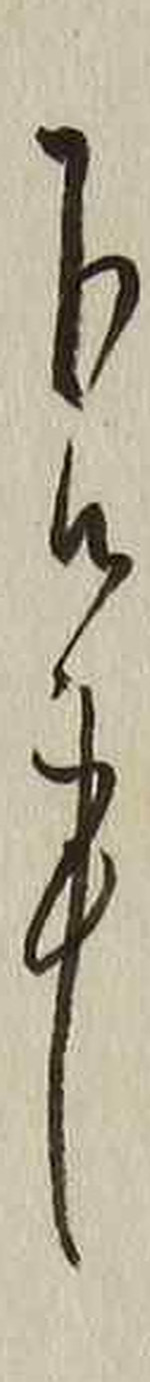下候事
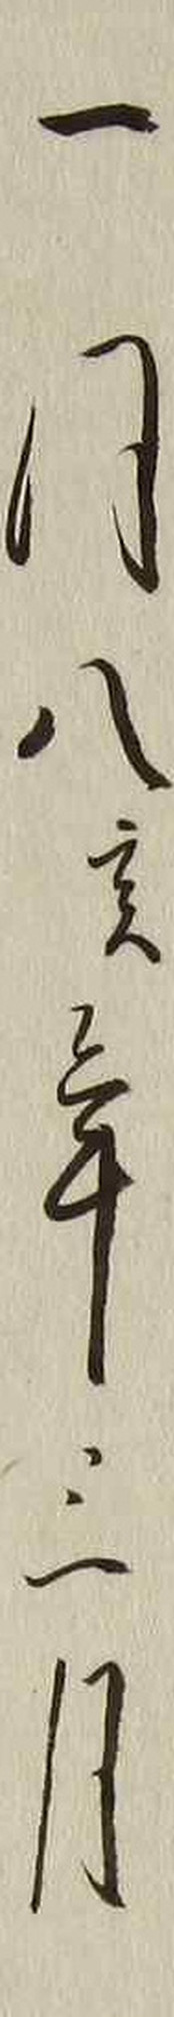一同八亥年三月
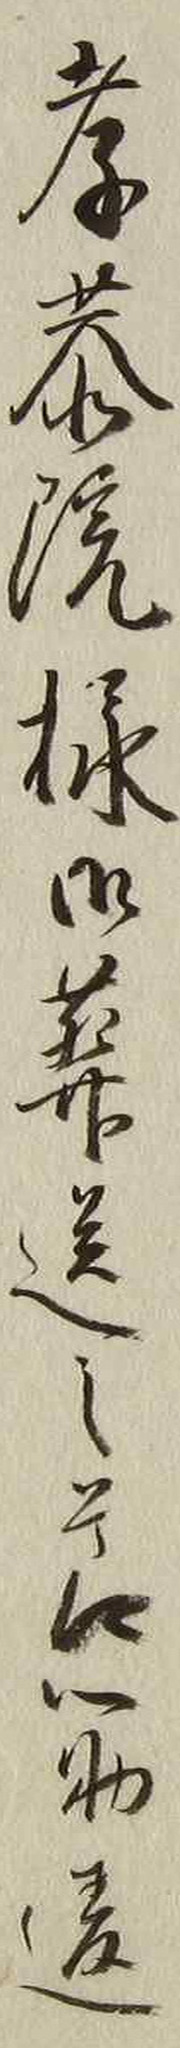孝恭院様御葬送之節筋違
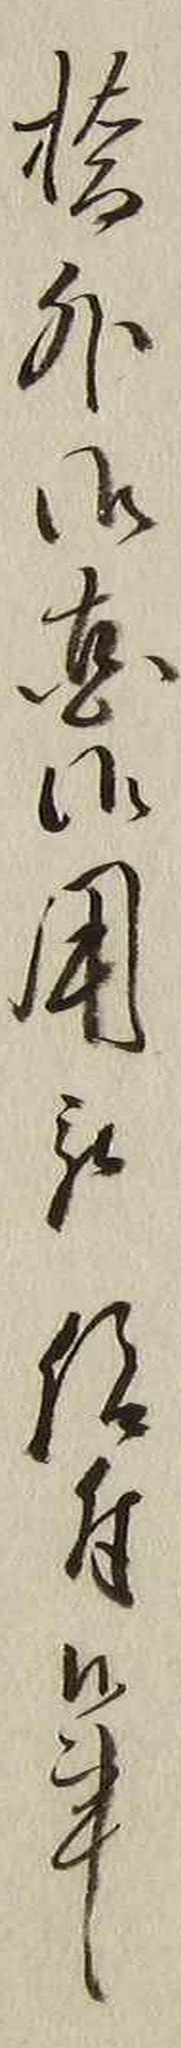橋外御固御用被仰付候事
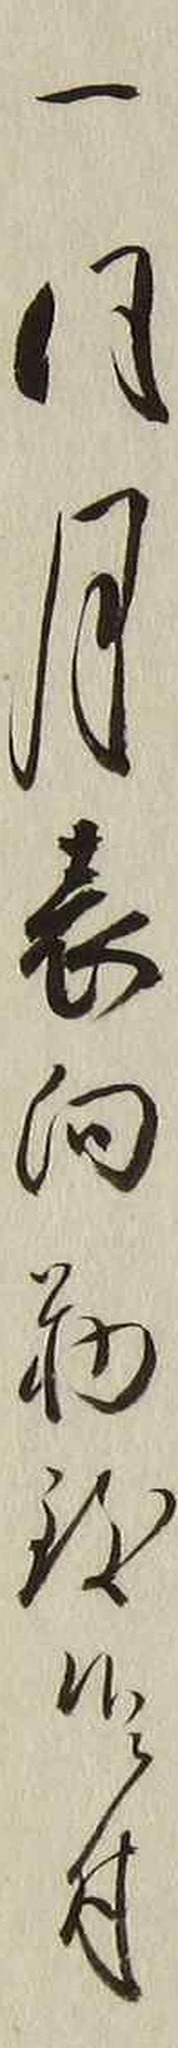一同月表向勤致候ニ付
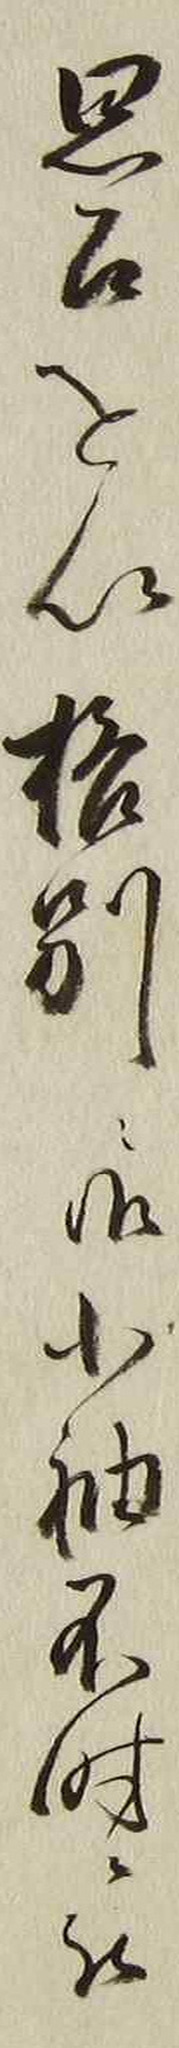思召を以格別ニ御小袖不時ニ被
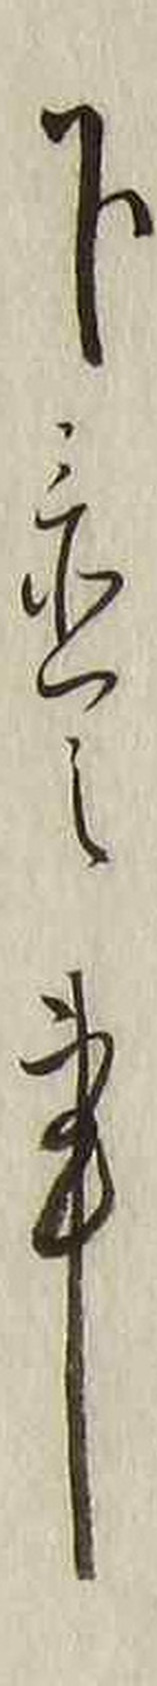下置之事
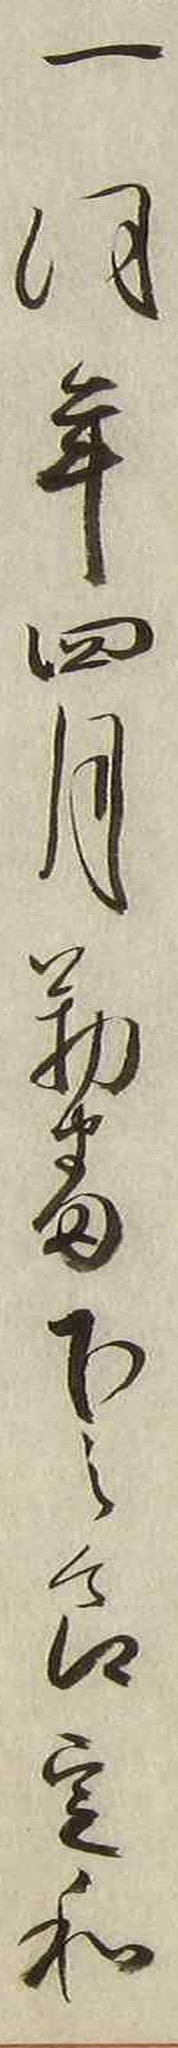一同年四月勤番下之節定和
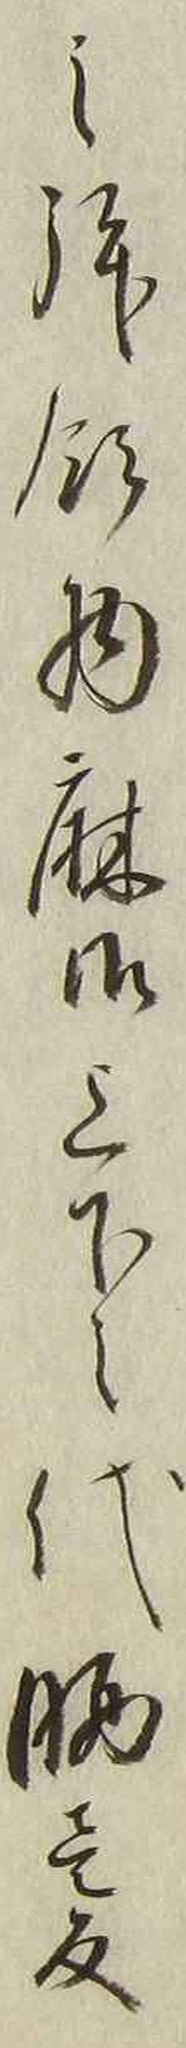之拝領物麻御上下之代晒壱反

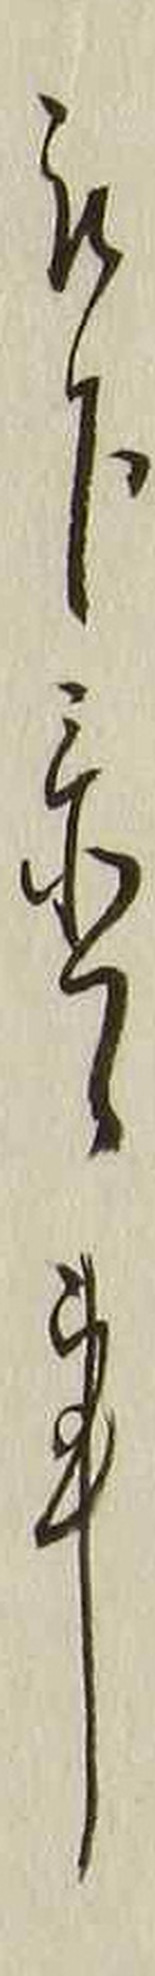被下置候事
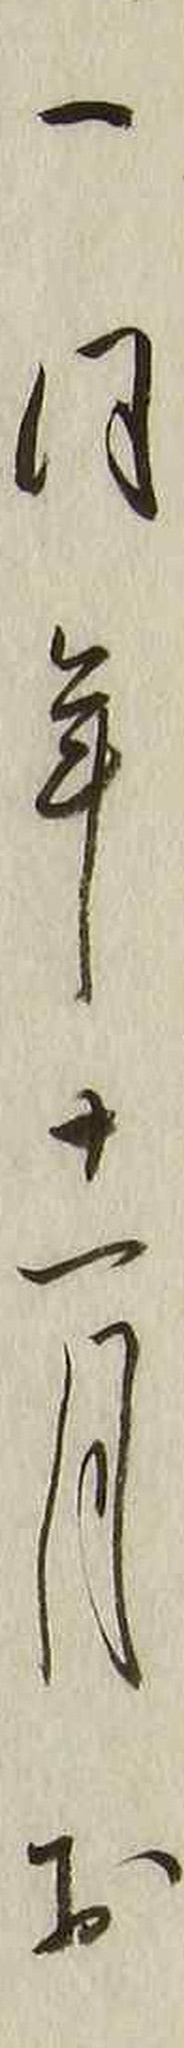一同年十一月於
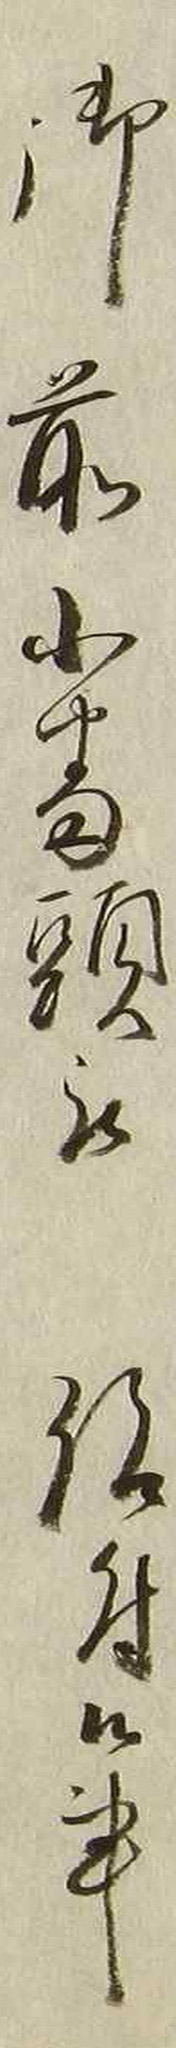御前小番頭被仰付候事
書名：諸士系譜　巻之18　い之部18
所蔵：会津若松市立会津図書館
